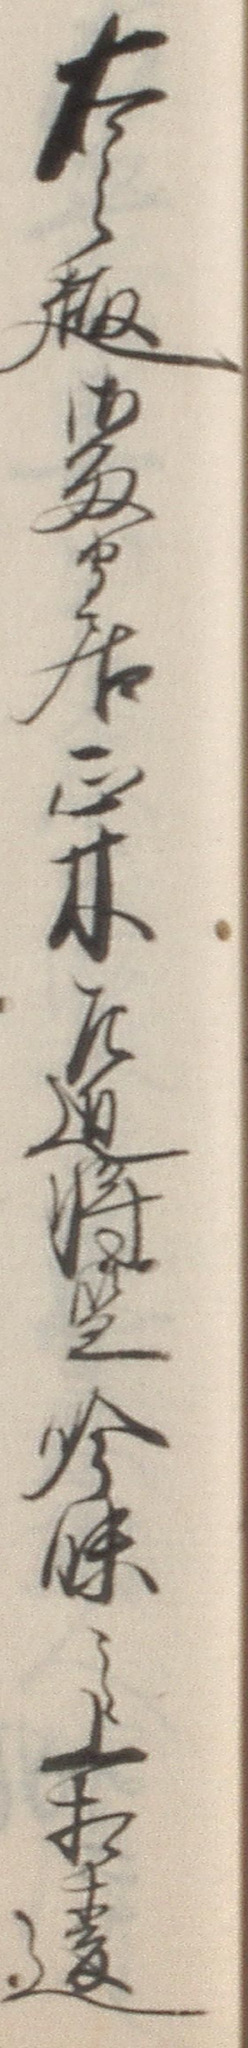右之趣御留守居正木左近将監吟味之上相違
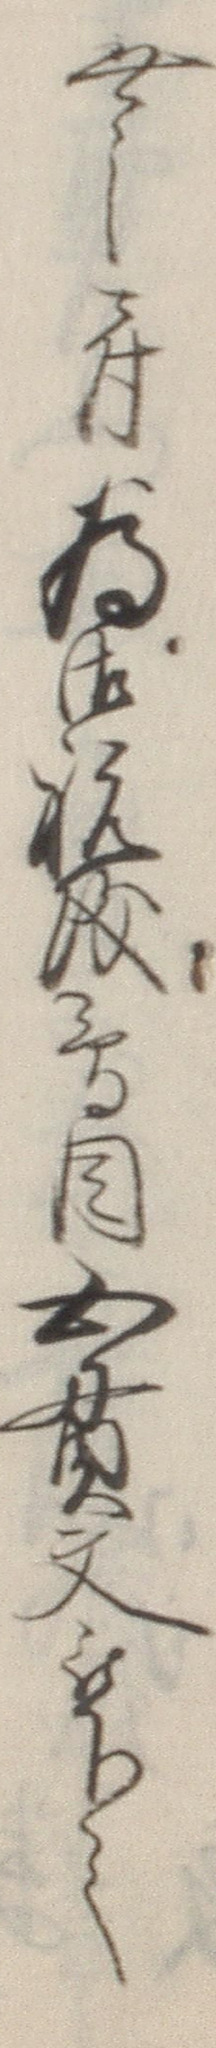無之ニ付為御祝儀鳥目五貫文被下候
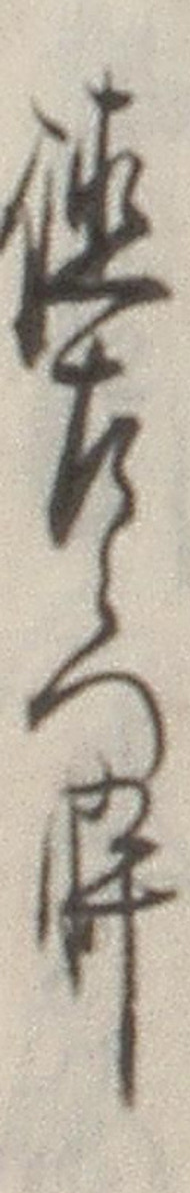徳左衛門倅
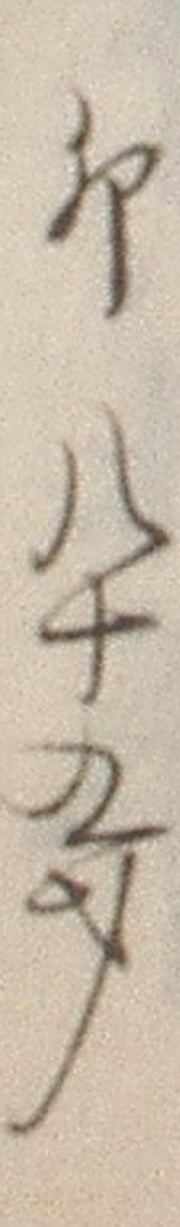卯八十九才
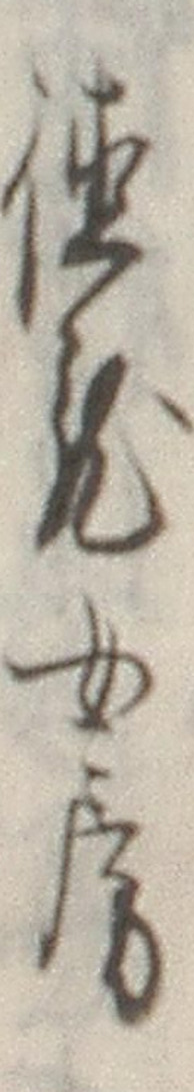徳蔵女房
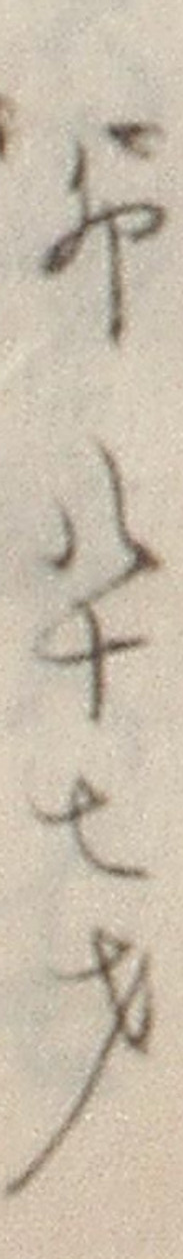卯八十七才
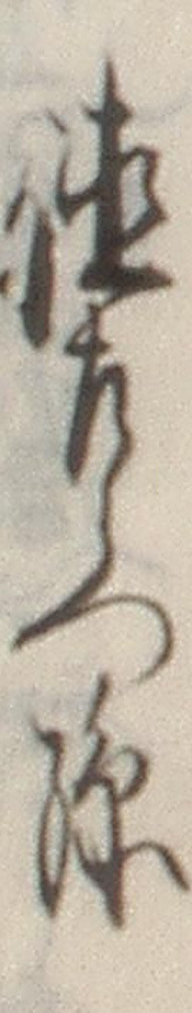徳左衛門倅
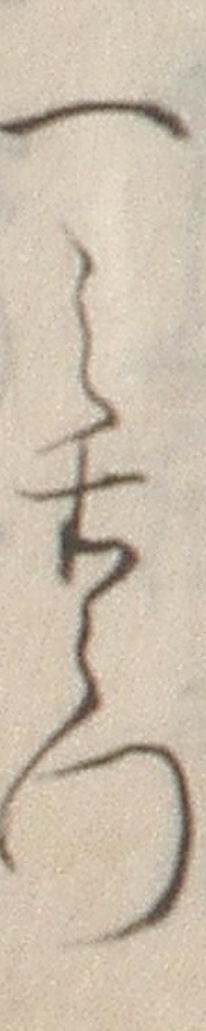一郎右衛門
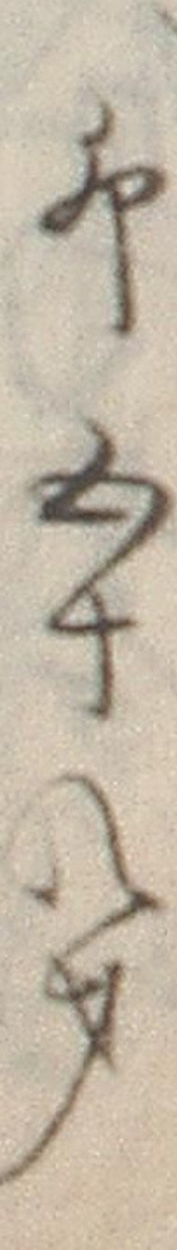卯五十八才
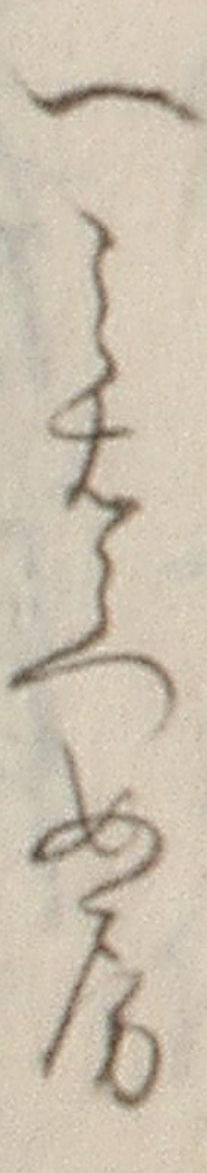一郎右衛門女房
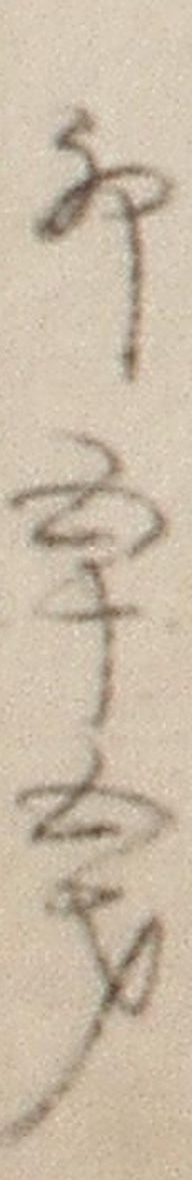卯五十五才

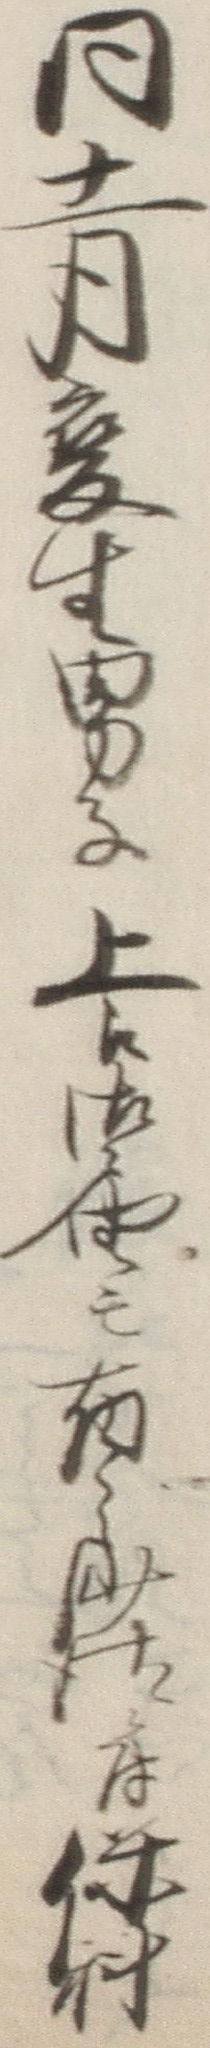同十一月変生男子上え御届も有之沙汰ニ付保科
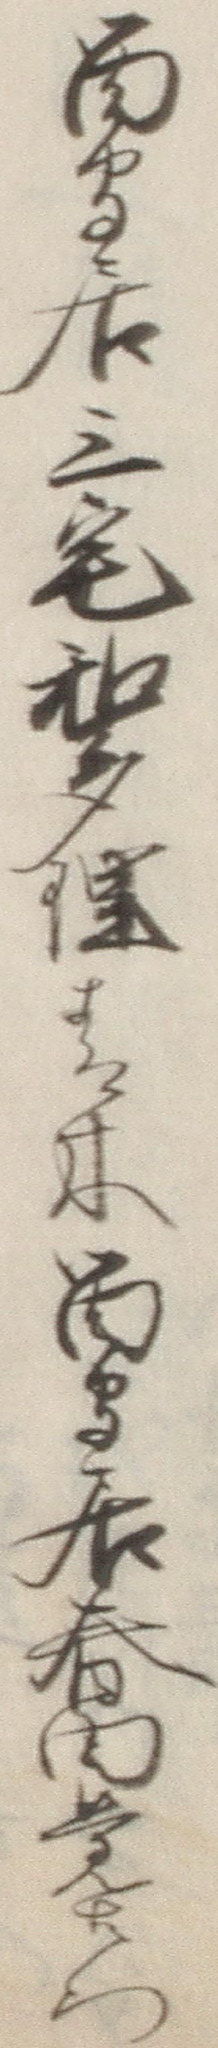留守居三宅和多理青木留守居春田覚左衛門
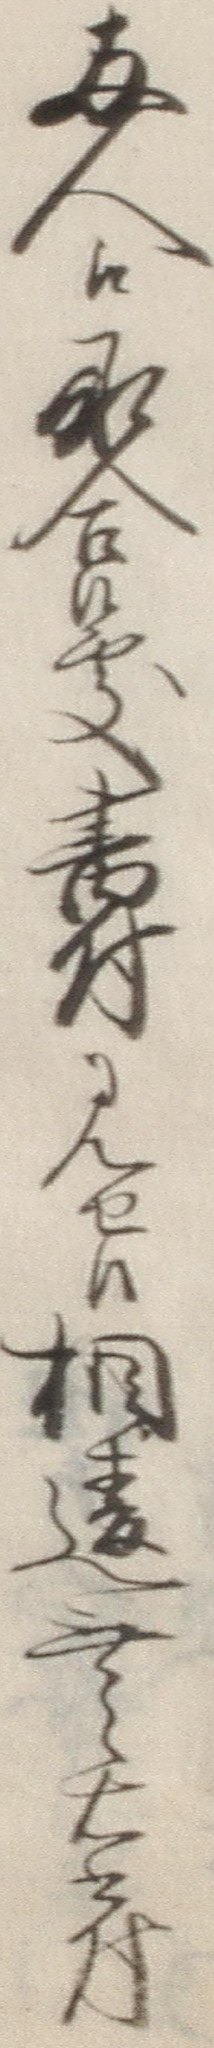両人え承合候処書付見セ候相違無之右書付
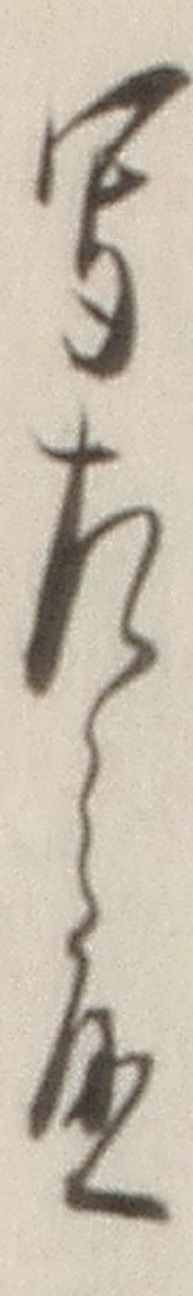写左之通
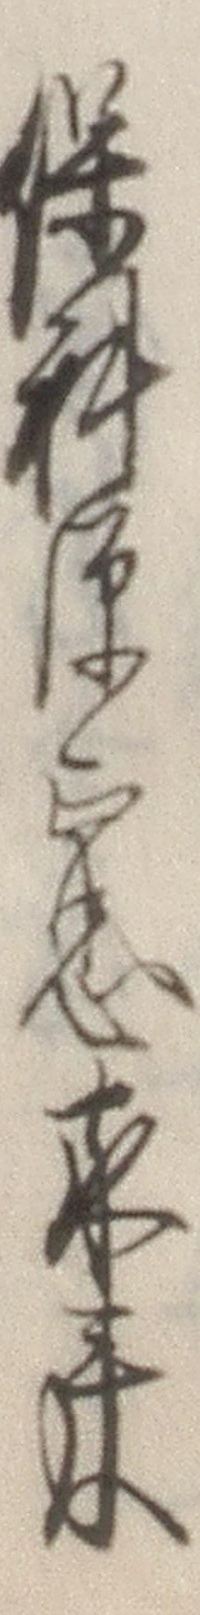保科弾正忠家来
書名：[諸国災害記録]
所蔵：東京大学地震研究所図書室 Earthquake Research Institute Library, The University of Tokyo, JAPAN
